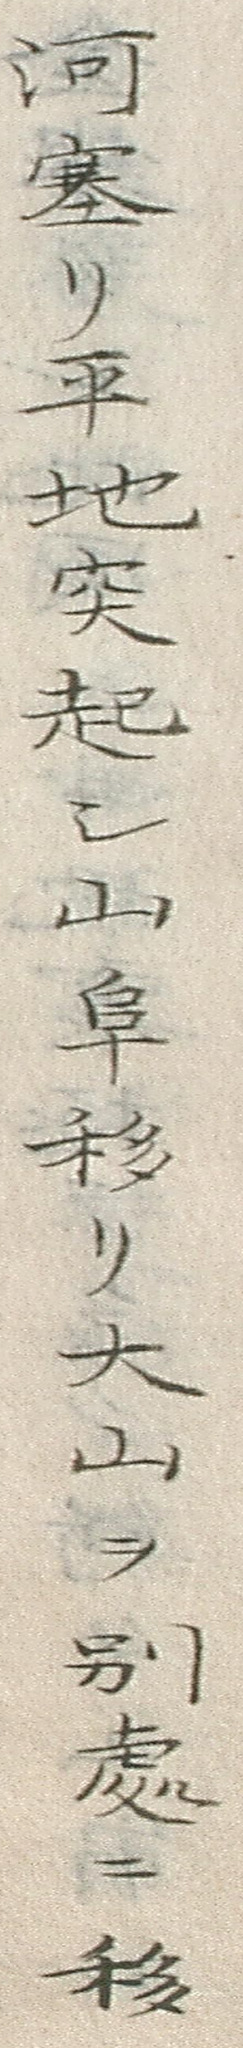河塞リ平地突起シ山阜移リ大山ヲ別処ニ移
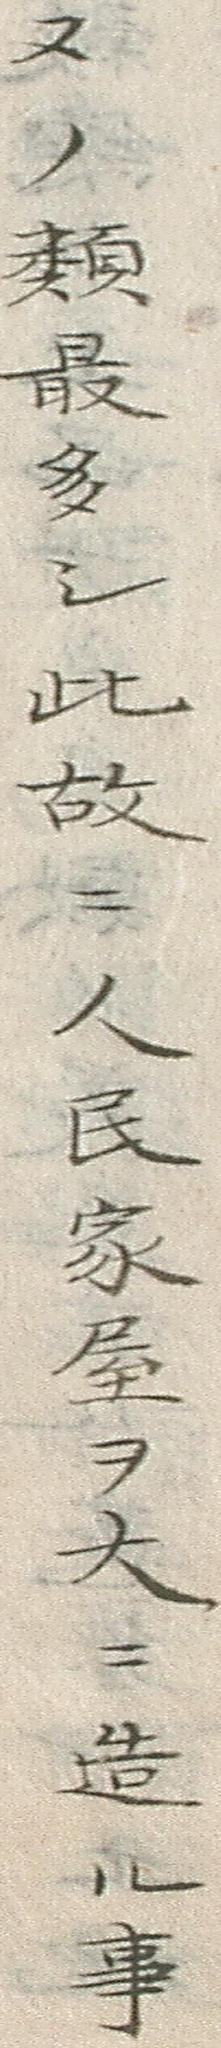スノ類最多シ此故ニ人民家屋ヲ大ニ造ル事
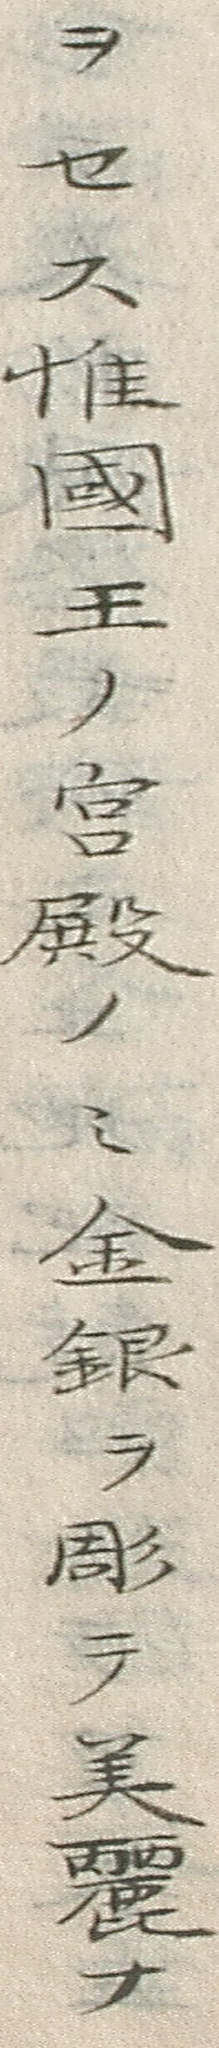ヲセス惟国王ノ宮殿ノミ金銀ヲ彫テ美麗ナ
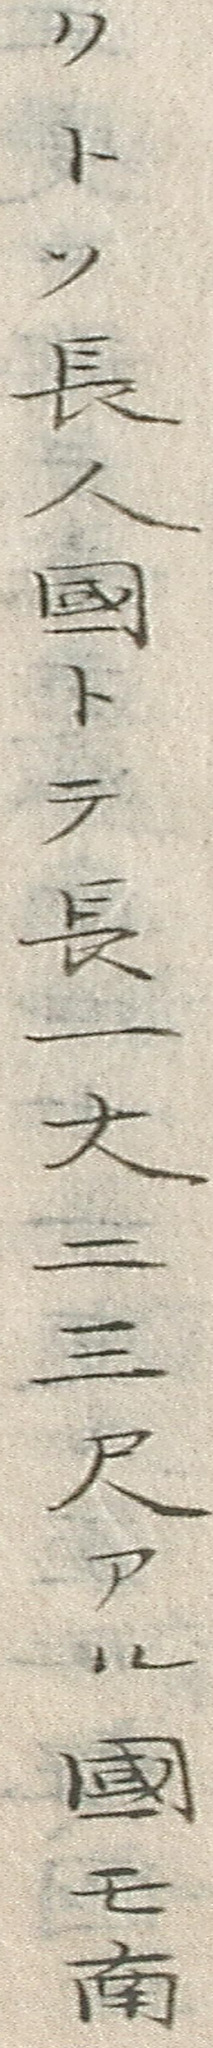リトソ長人国トテ長一丈二三尺アル国モ南
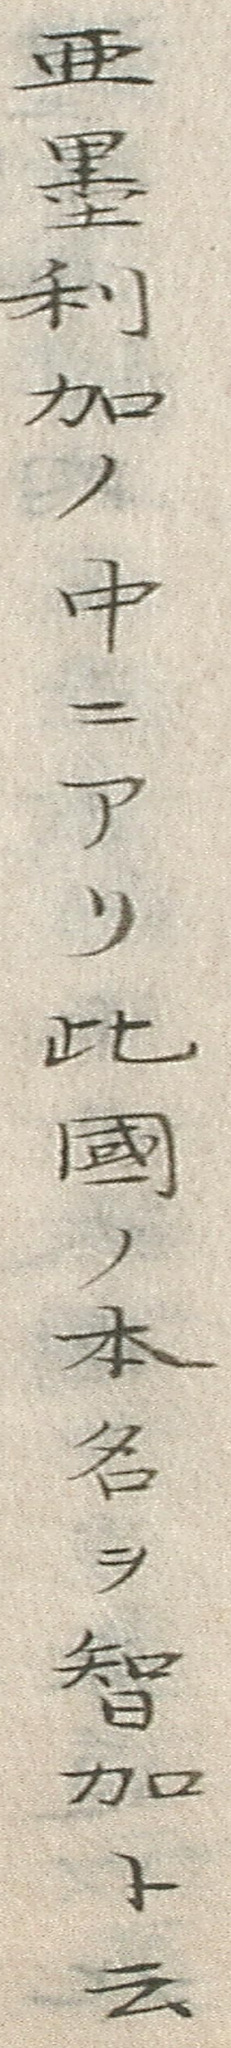亜墨利加ノ中ニアリ此国ノ本名ヲ智加ト云
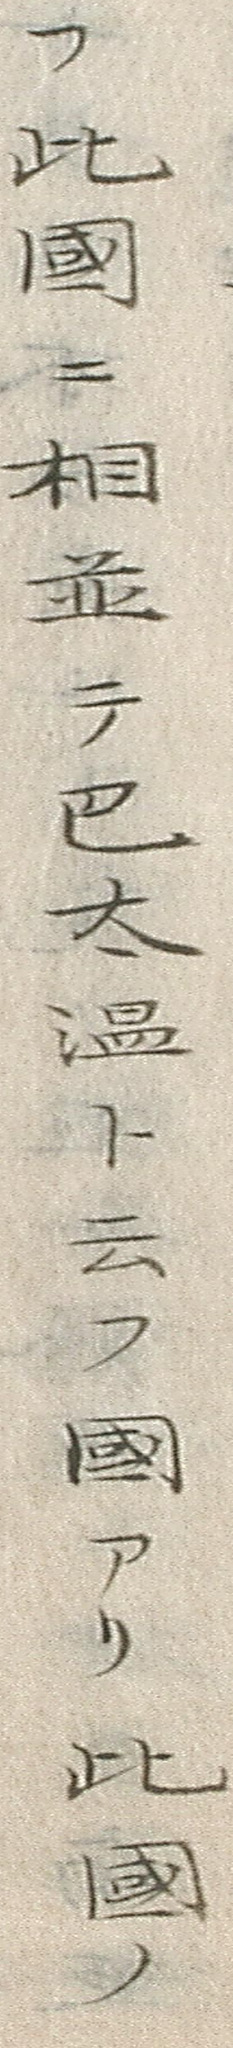フ此国ニ相並テ巴太温ト云フ国アリ此国ノ
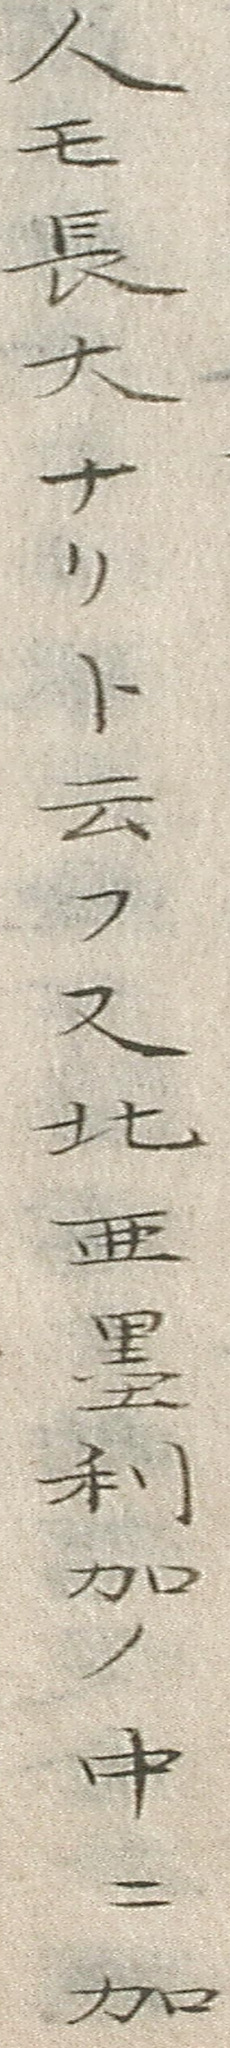人モ長大ナリト云フ又北亜墨利加ノ中ニ加
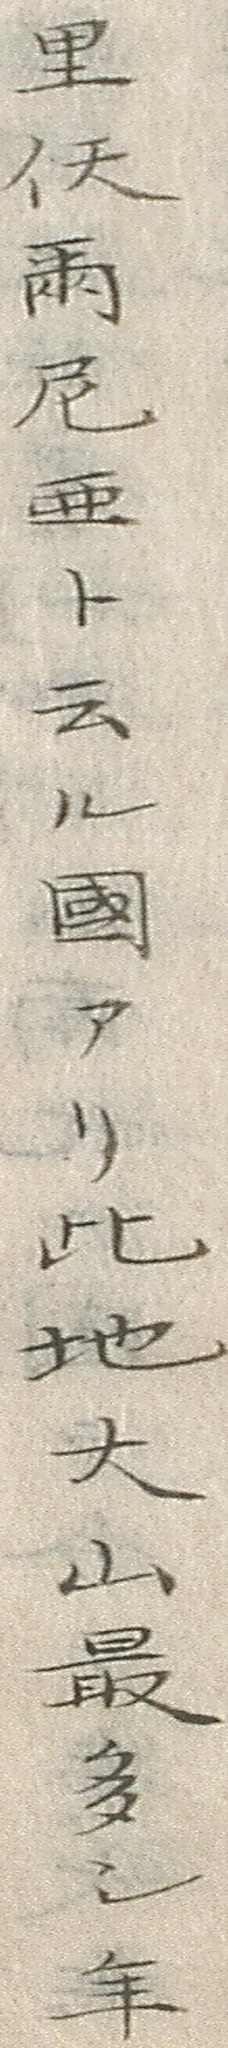里伕爾尼亜ト云ル国アリ此地大山最多シ年
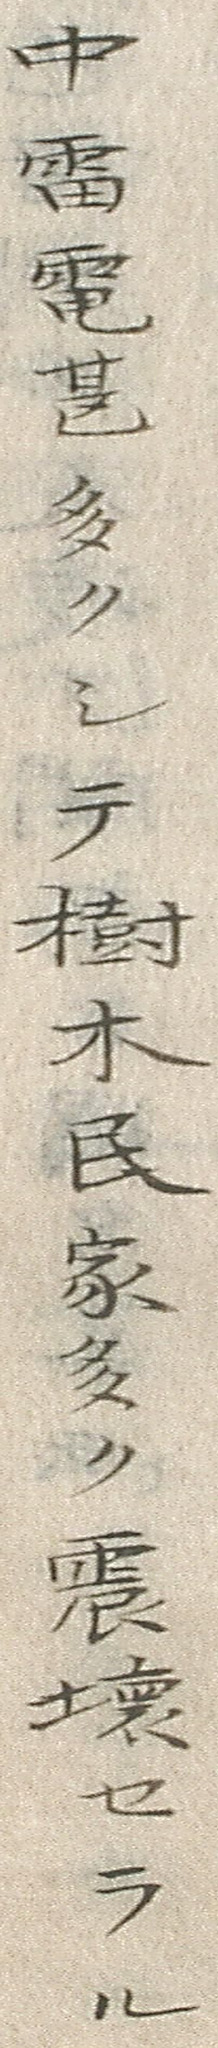中雷電甚多クシテ樹木民家多ク震壊セラル
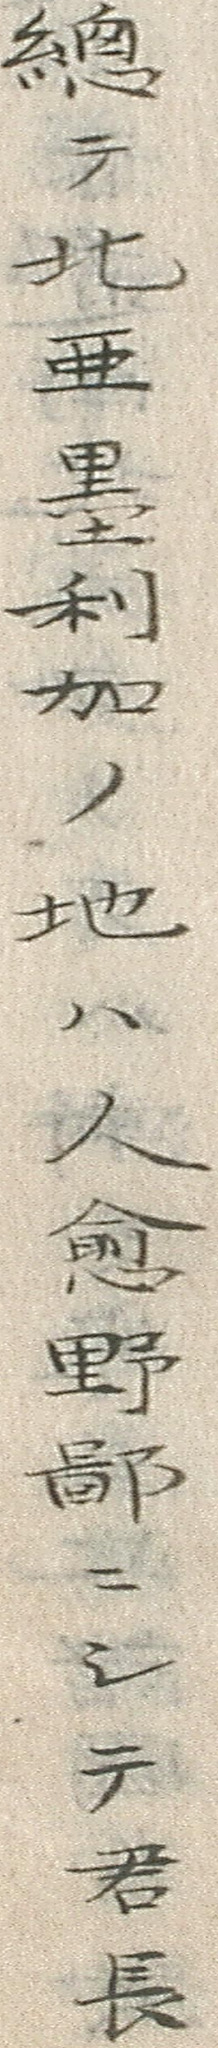総テ北亜墨利加ノ地ハ人愈野鄙ニシテ君長
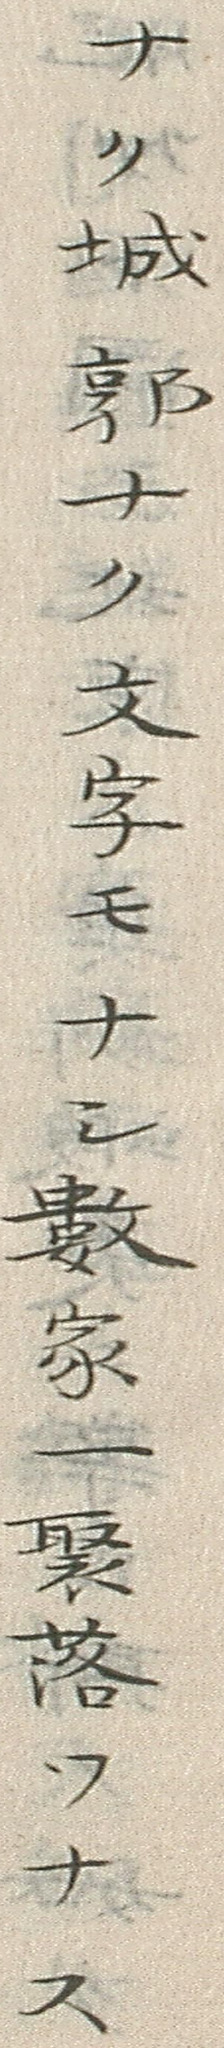ナク城郭ナク文字モナシ数家一聚落ヲナス
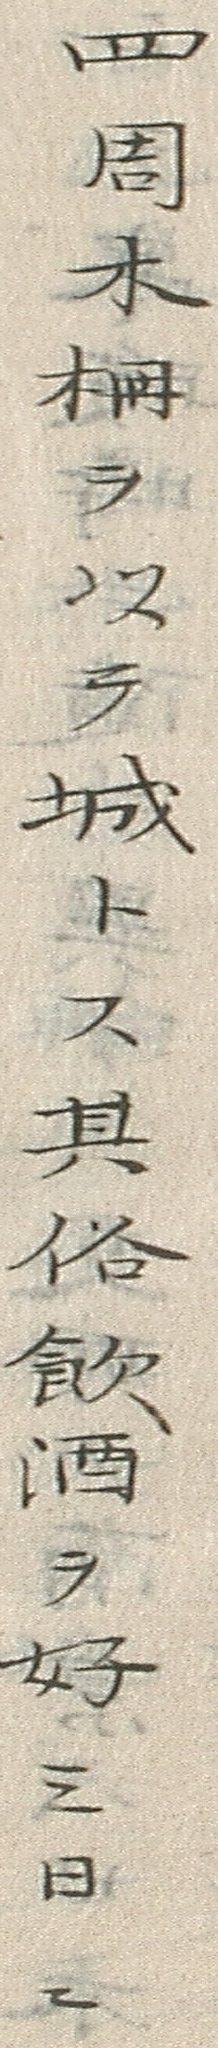四周木柵ヲ以テ城トス其俗飲酒ヲ好ミ日〻
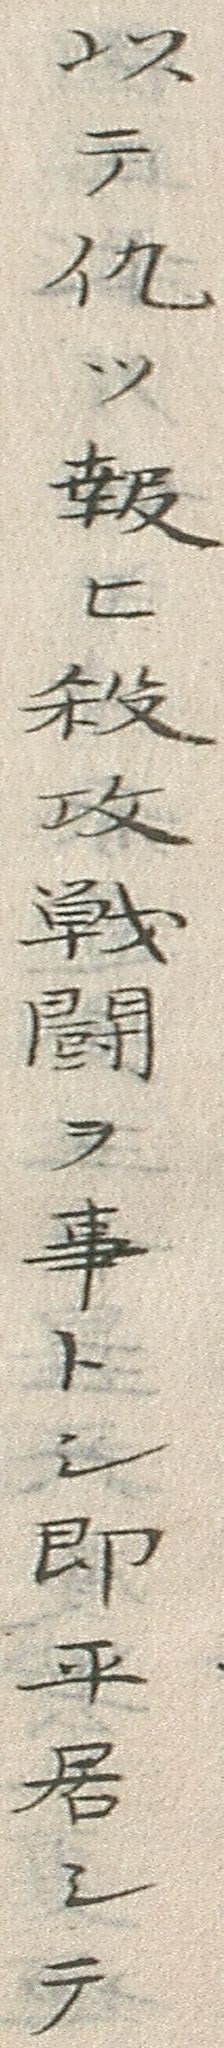以テ仇ッ報ヒ殺攻戦闘ヲ事トシ即平居シテ
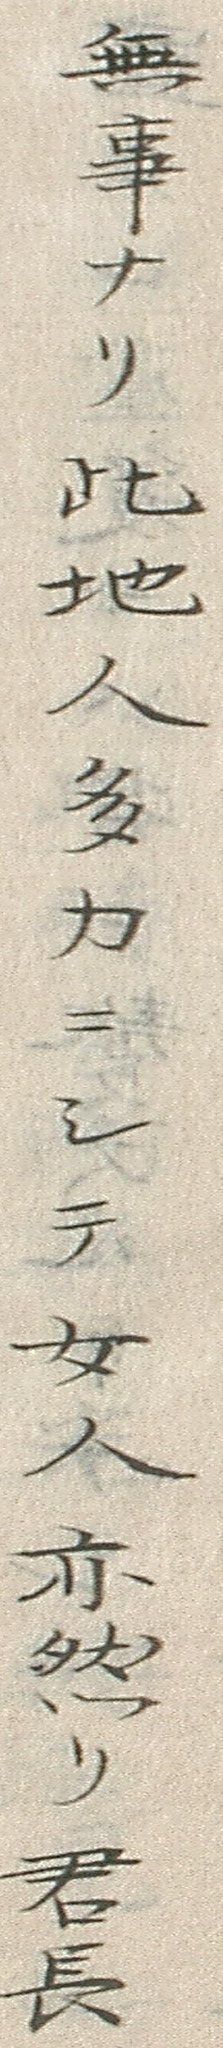無事ナリ此地人多カニシテ女人亦然リ君長
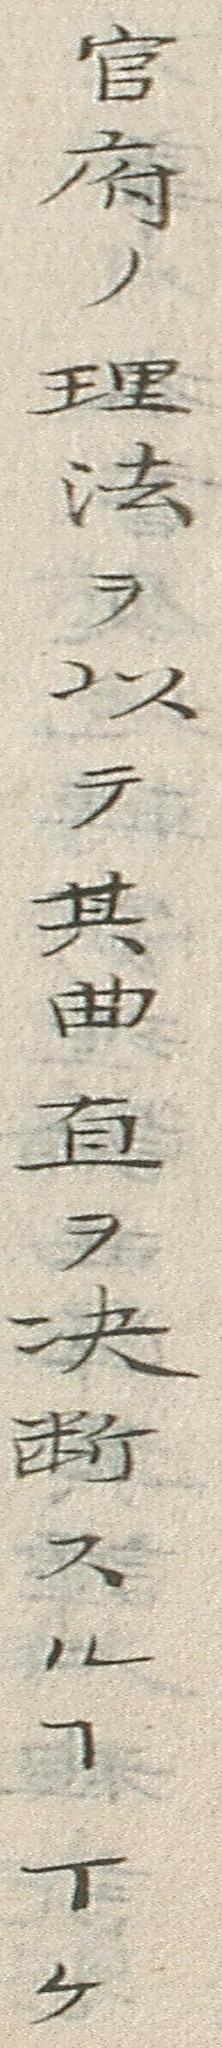官府ノ理法ヲ以テ其曲直ヲ決断スルコトナケ
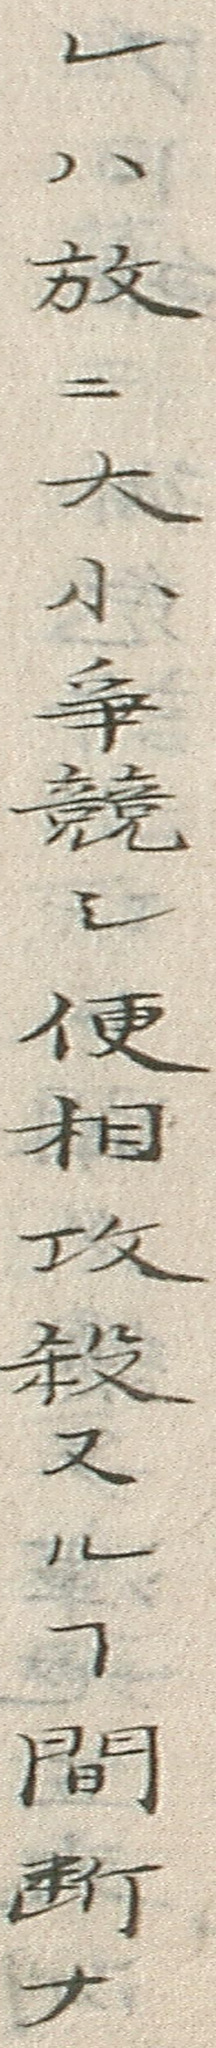レハ放ニ大小争競シ便相攻殺スルコト間断ナ
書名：天學略名目羽翼　全
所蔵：東京大学地震研究所図書室 Earthquake Research Institute Library, The University of Tokyo, JAPAN
